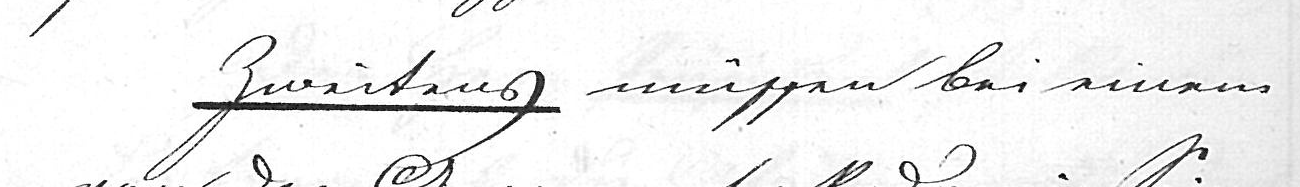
Zweitens müssen bei einem
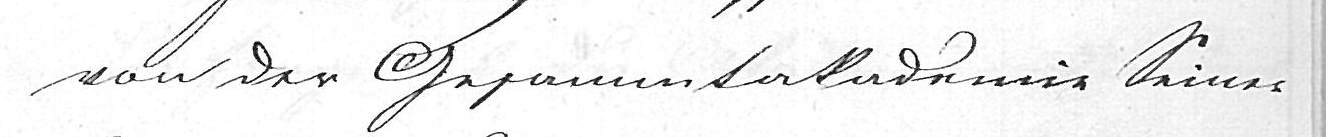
von der Gesammtakademie Seiner
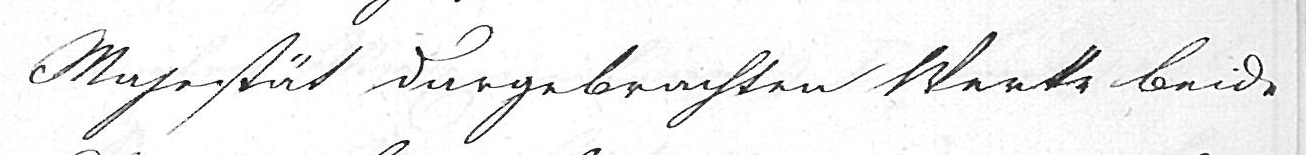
Majestät dargebrachten Werke beide
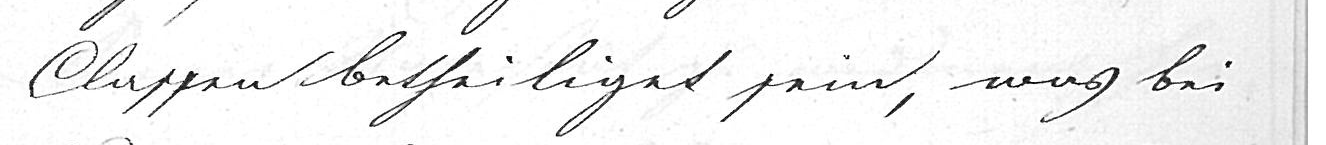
Classen betheiliget sein, was bei
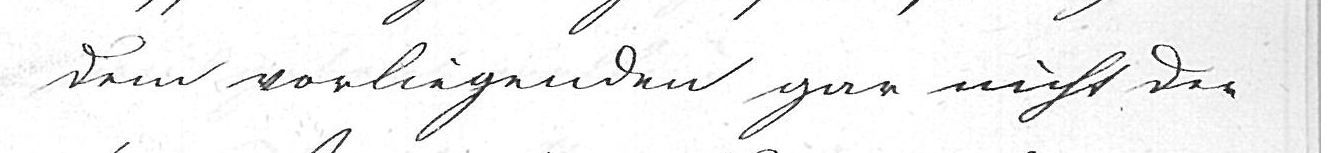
dem vorliegenden gar nicht der
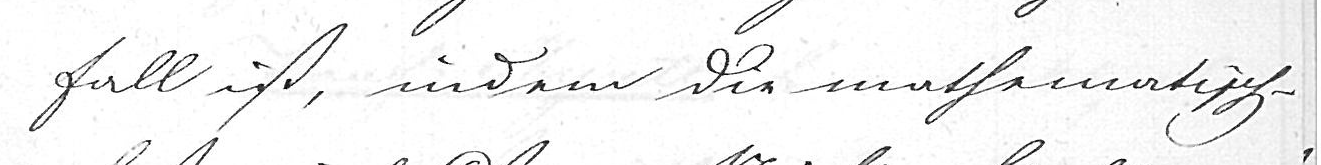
Fall ist, indem die mathematisch-
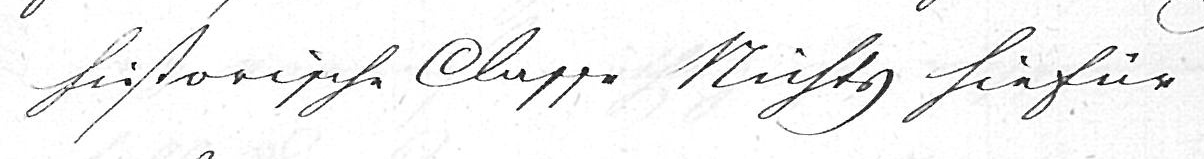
historische Classe Nichts hiefür
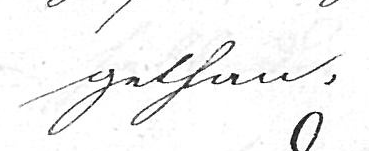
gethan.
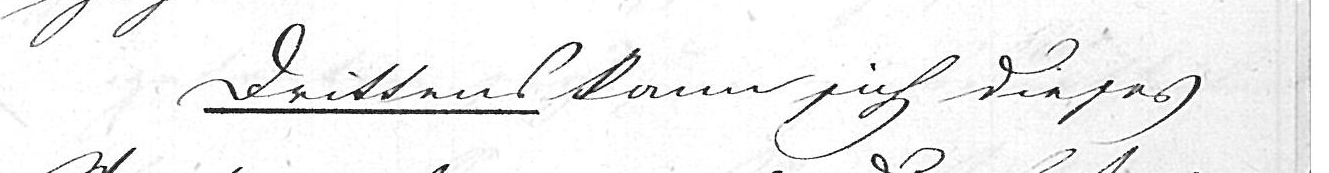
Drittens kann sich dieses
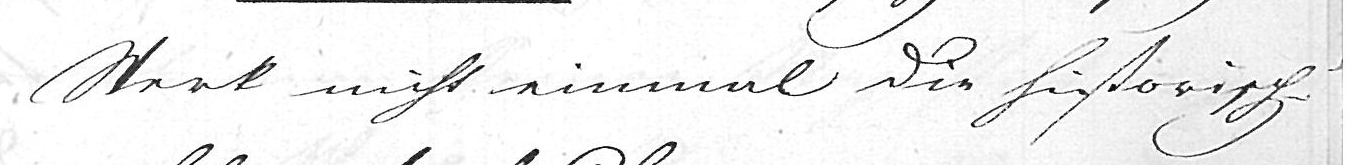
Werk nicht einmal die historisch-
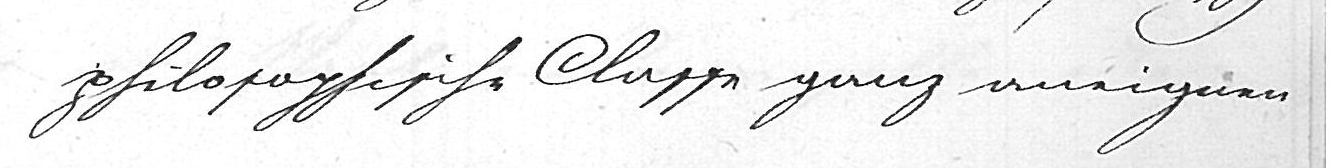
philosophische Classe ganz aneignen
